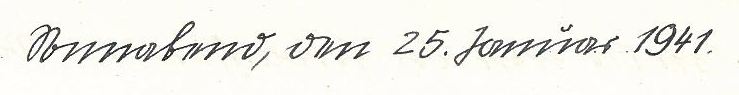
Sonnabend, den 25. Januar 1941.
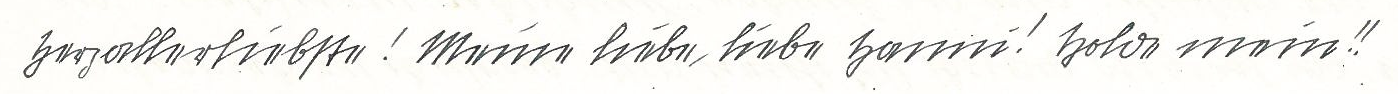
Herzallerliebste! Meine liebe, liebe ! Holde mein!!
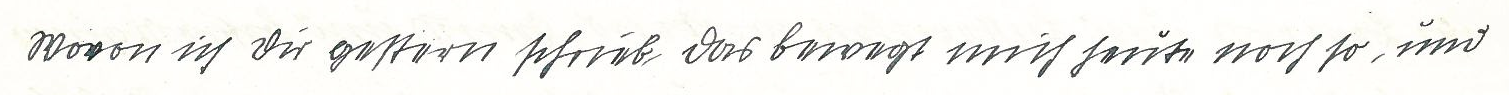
Wovon ich Dir gestern schrieb, das bewegt mich heute noch so, und
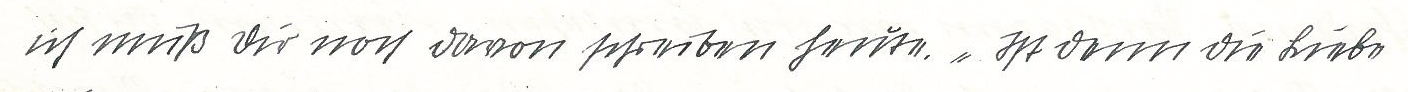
ich muß Dir noch davon schreiben heute. „Ist denn die Liebe
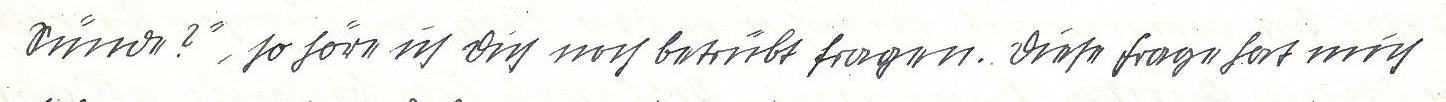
Sünde?“, so höre ich Dich noch betrübt fragen. Diese Frage hat mich
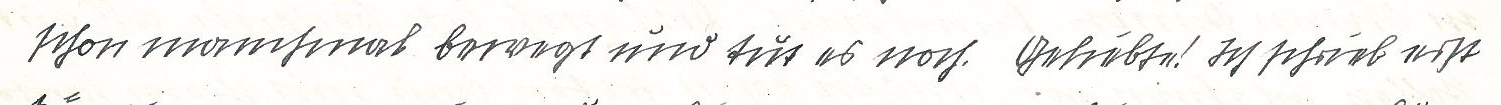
schon manchmal bewegt und tut es noch. Geliebte! Ich schrieb erst
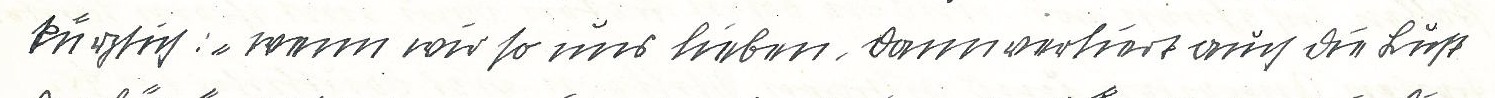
kürzlich: „wenn wir so uns lieben, dann verliert auch die Lust
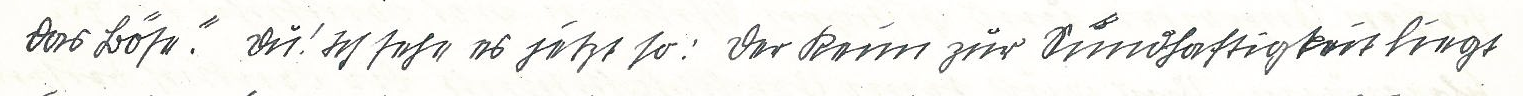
das Böse.“ Du! Ich sage es jetzt so: Der Keim zur Sündhaftigkeit liegt
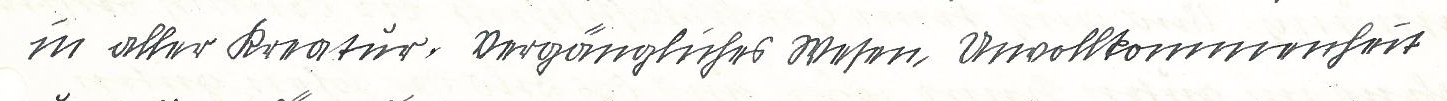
in aller Kreatur. Vergängliches Wesen, Unvollkommenheit
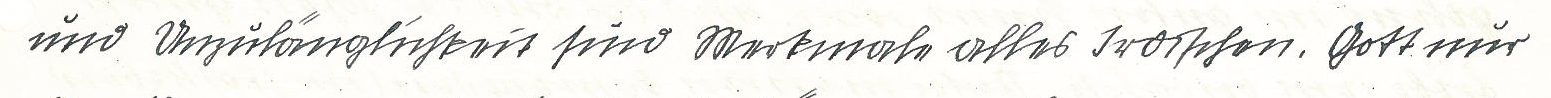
und Unzulänglichkeit sind Merkmale alles Irdischen. Gott nur
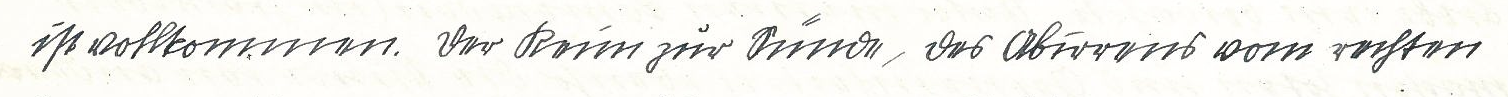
ist vollkommen. Der Keim zur Sünde, des Abirrens vom rechten
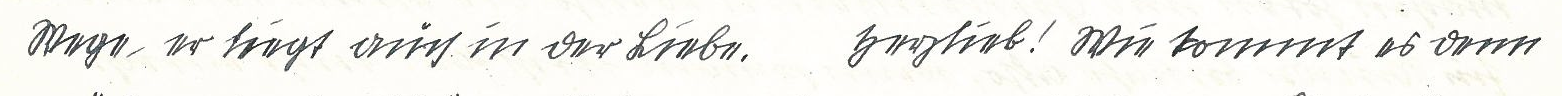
Wege, es liegt auch in der Liebe. Herzlieb! Wie kommt es denn
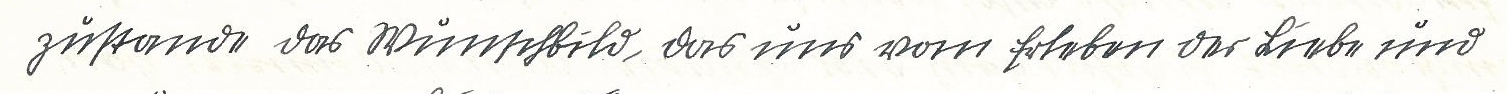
zustande das Wunschbild, das uns vom Erleben der Liebe und
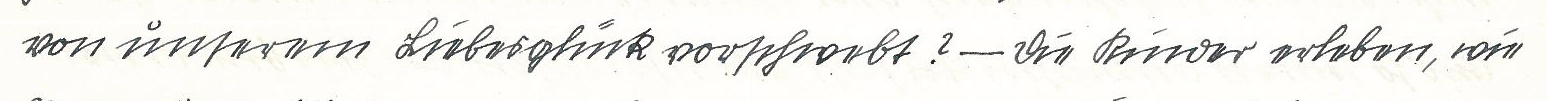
von unserem Liebesglück vorschwebt? – Die Kinder erleben, wie
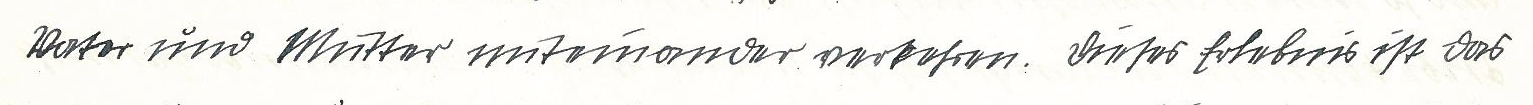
Vater und Mutter miteinander verkehren. Dieses Erlebnis ist das
